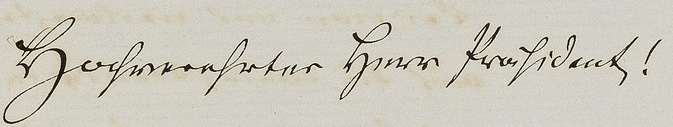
Hochverehrter Herr Präsident!
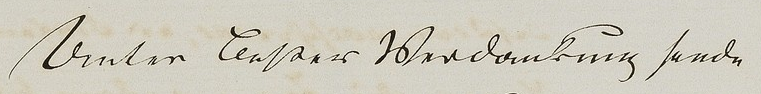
Unter bester Verdankung sende
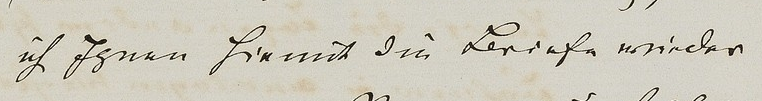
ich Ihnen hiemit die Briefe wieder
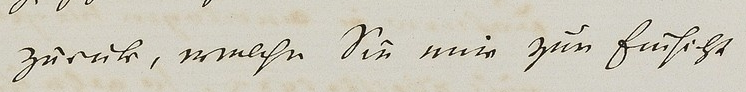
zurük, welche Sie mir zur Einsicht
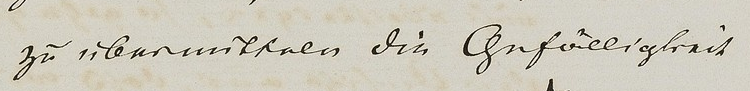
zu übermitteln die Gefälligkeit
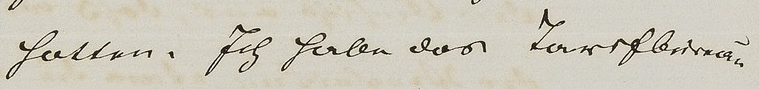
hatten. Ich habe das Tarifbüreau
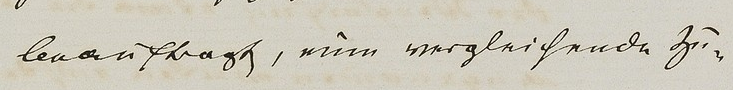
beauftragt, eine vergleichende Zu-
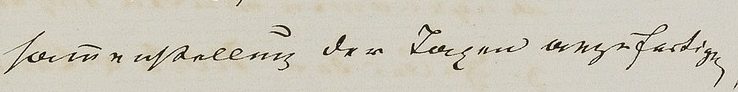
sammenstellung der Taxen anzufertigen,
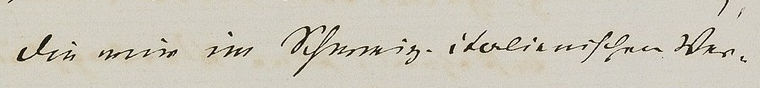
die wir im Schweiz-italienischen Ver-
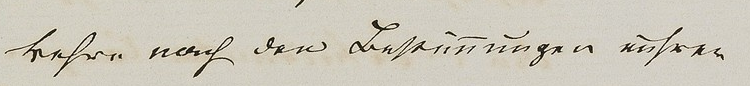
kehre nach den Bestimmungen unsrer
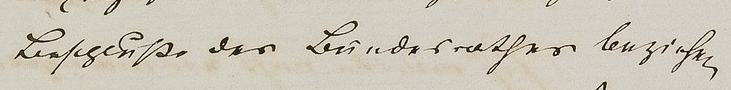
Beschluße des Bundesrathes beziehen
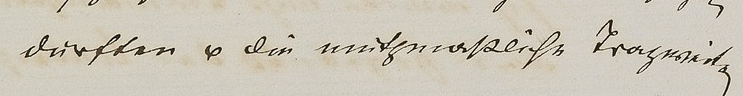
dürften & die muthmaßliche Tragweite
